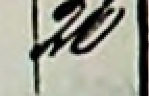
26
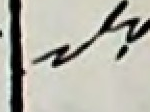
do
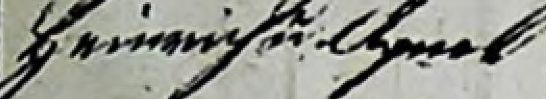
Heinrich u. Agnes
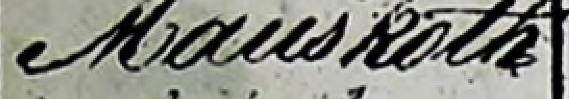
Mauskoth
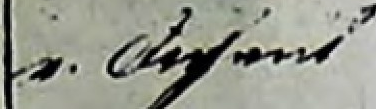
v. Infant
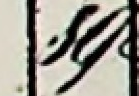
89
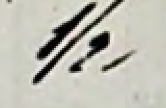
1/2
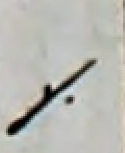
./.
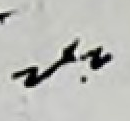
do
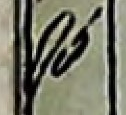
95
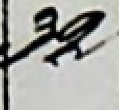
32
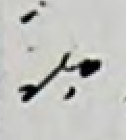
do
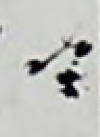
do
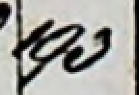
193
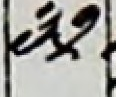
32
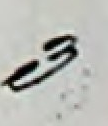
3
